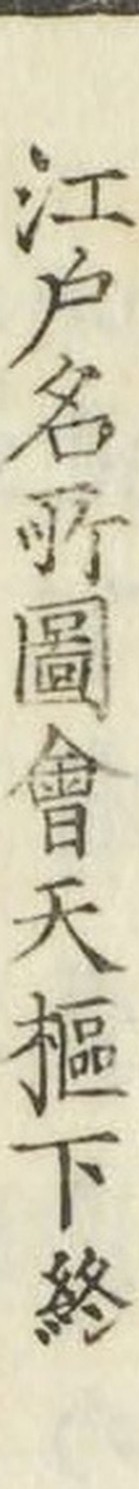江戸名所圖會天樞下終
